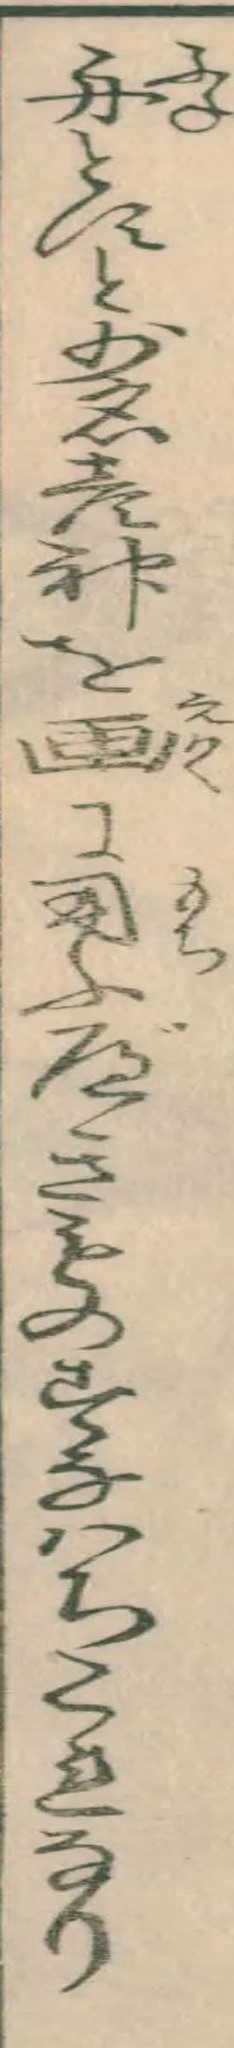舟とすと少名彦神を画に用ふべきものすなはちこれなり
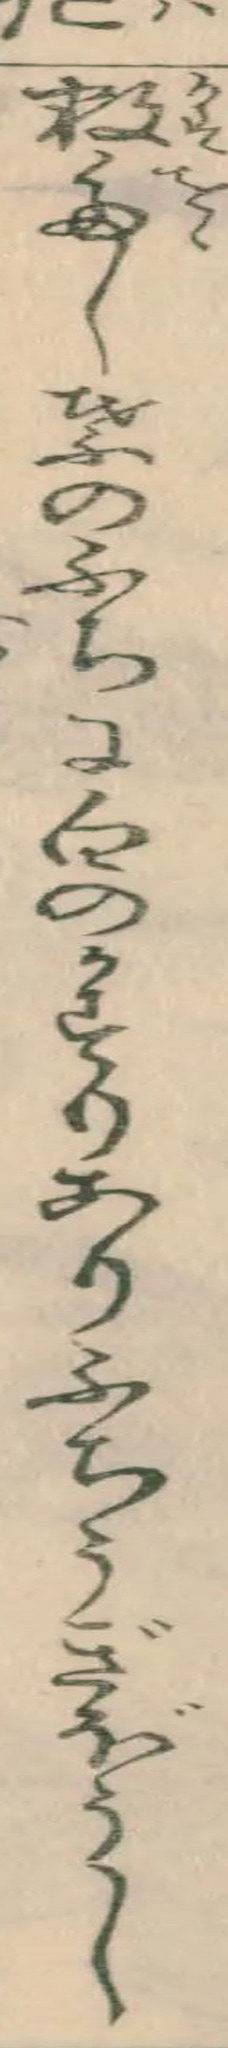数多し葉のふちに白のかすりありふちうぎぼうし
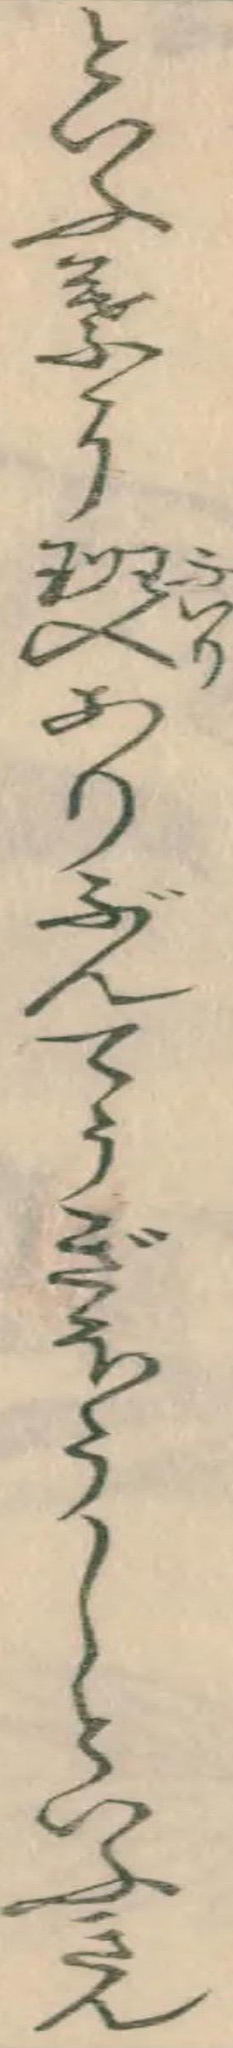といふ葉に班入ありぶんてうぎほうしといふきん
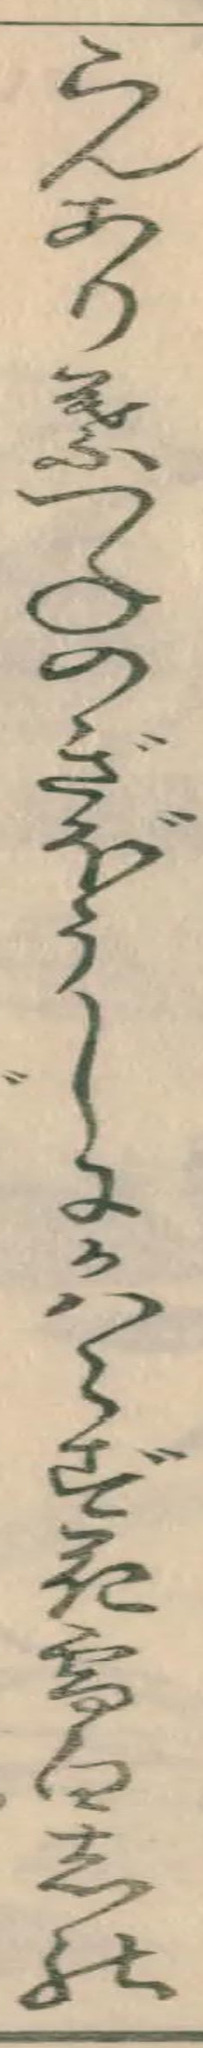らんあり葉つねのぎぼうしにかはらず花雪白しの
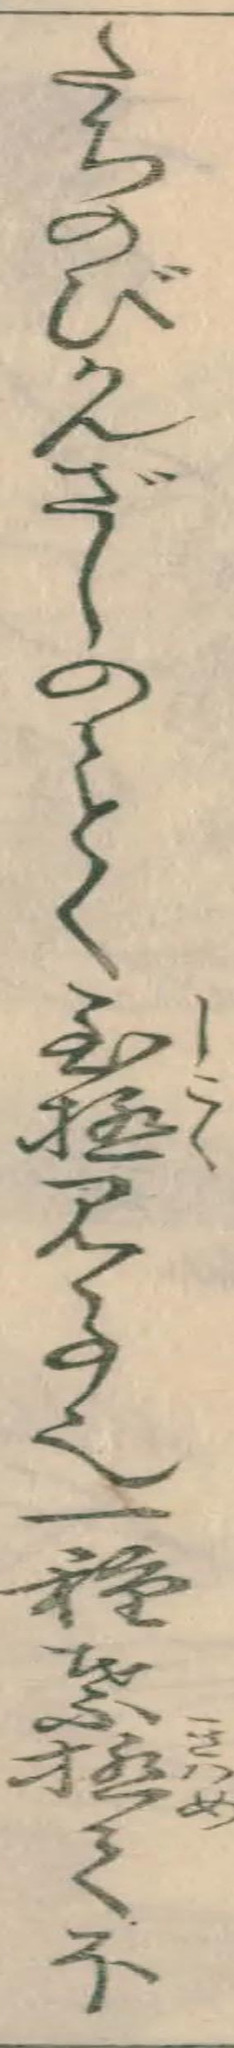たちのびかんざしのことく至極見事也一種葉極てほ
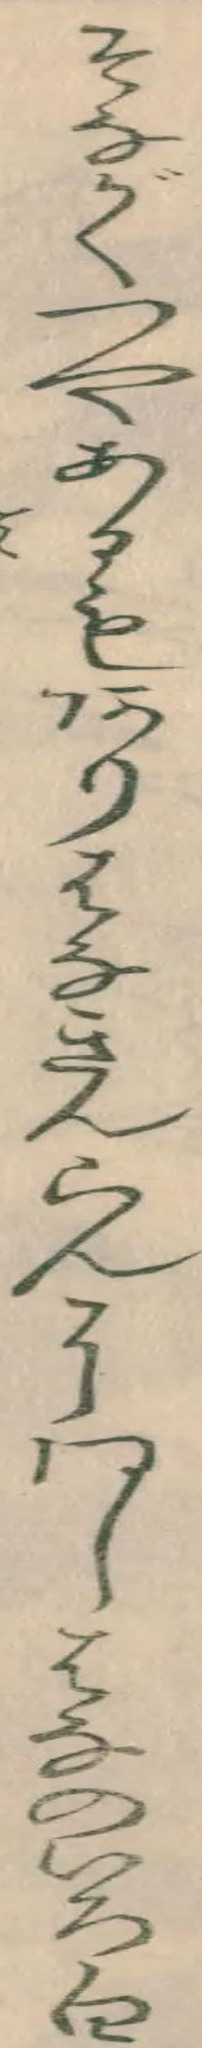そながくつやあるもありはなきんらんに同しはなのいろ白
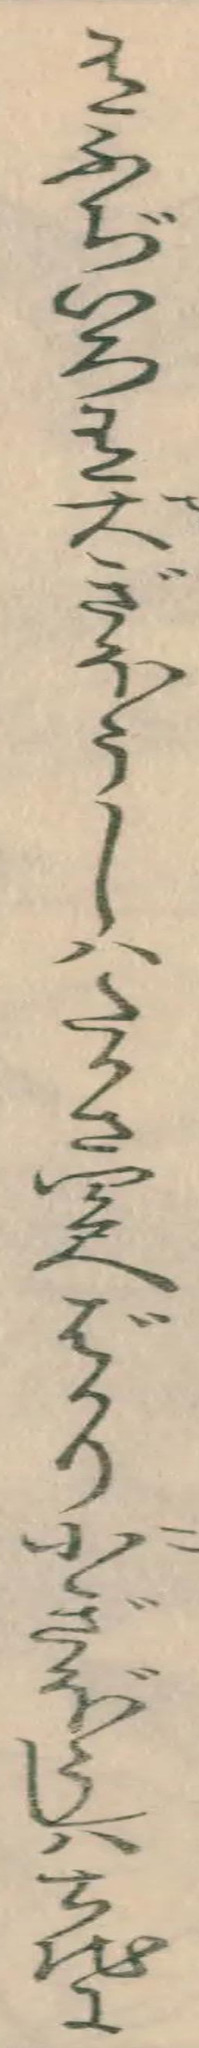有ふぢいろ有大ぎほうしはたかさ四尺ばかり小ぎぼうしは土地に
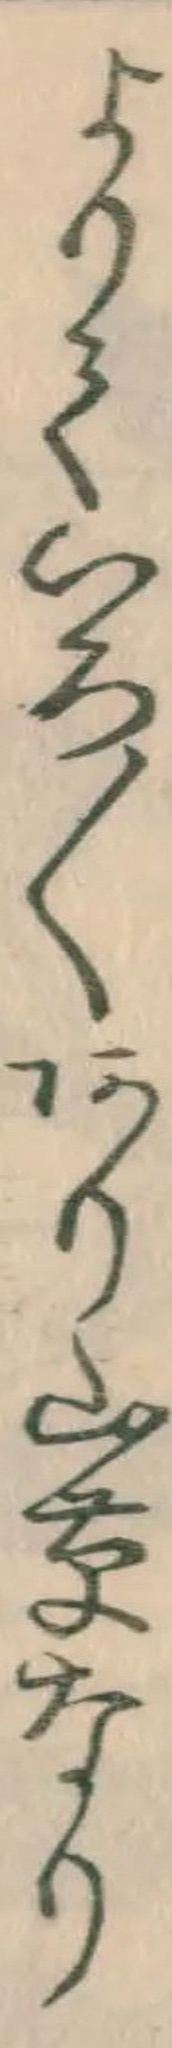よりていろ〳〵あり山草なり
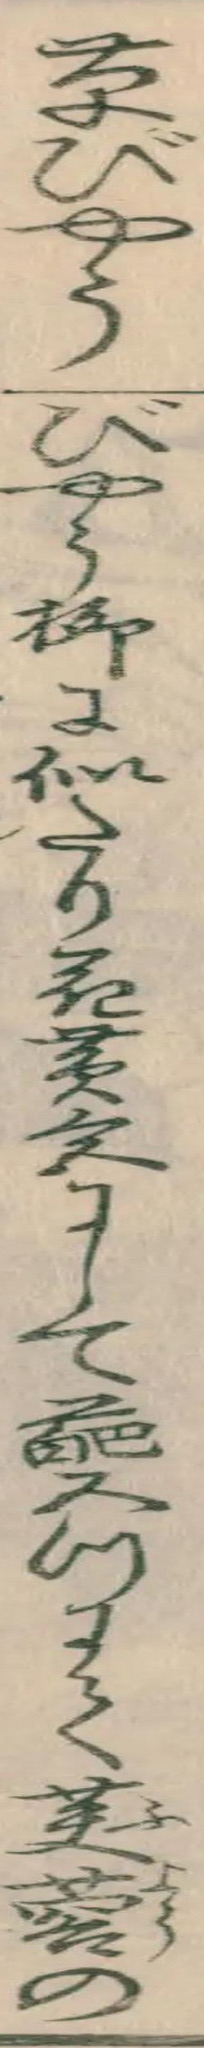[草びやう]びやう柳に似たり花黄色にして葩五つにて芙蓉の
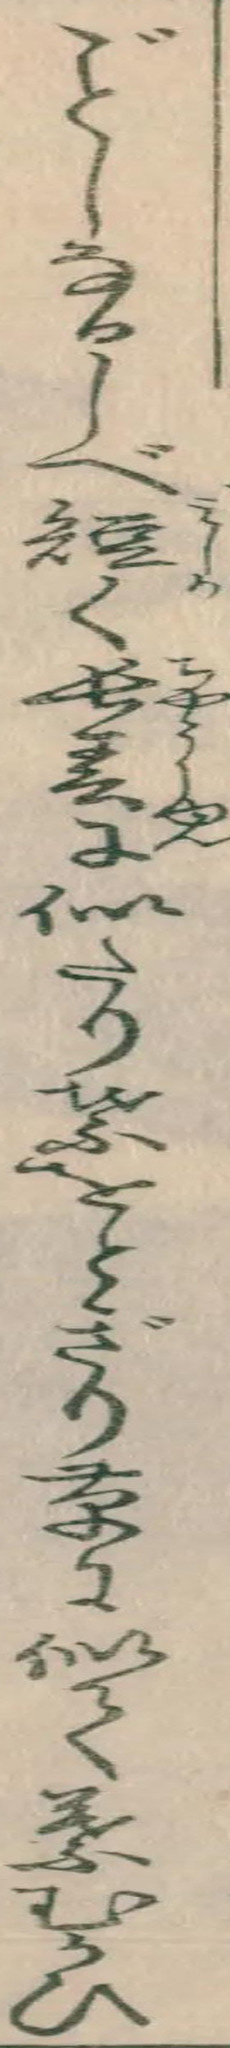ごとしなるしべ短く長春に似たり葉をとぎり草に似て葉むかひ
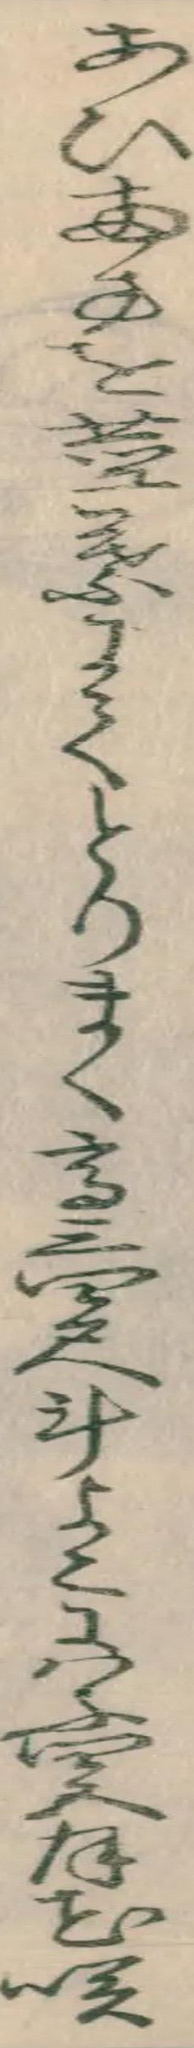あひ両方を茎葉にてとりまく高三四尺斗よこにはふ四五月花咲
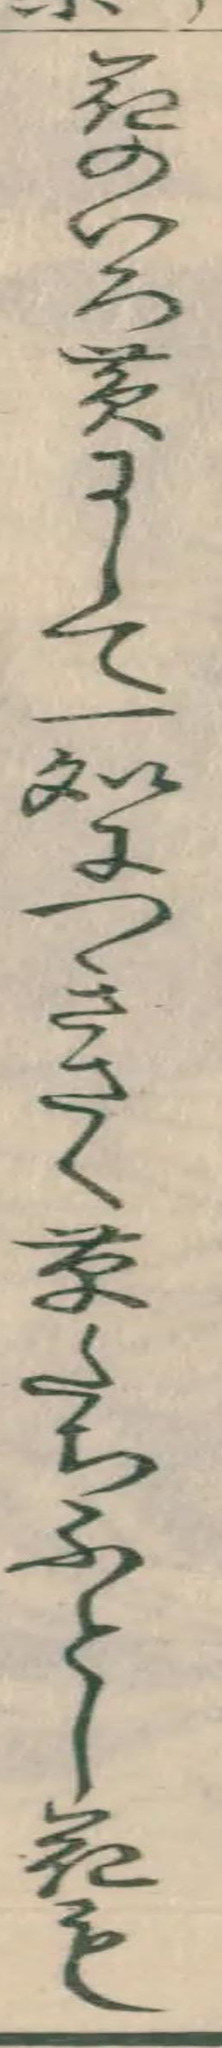花のいろ黄にして一処につきさく草たちふとし花も
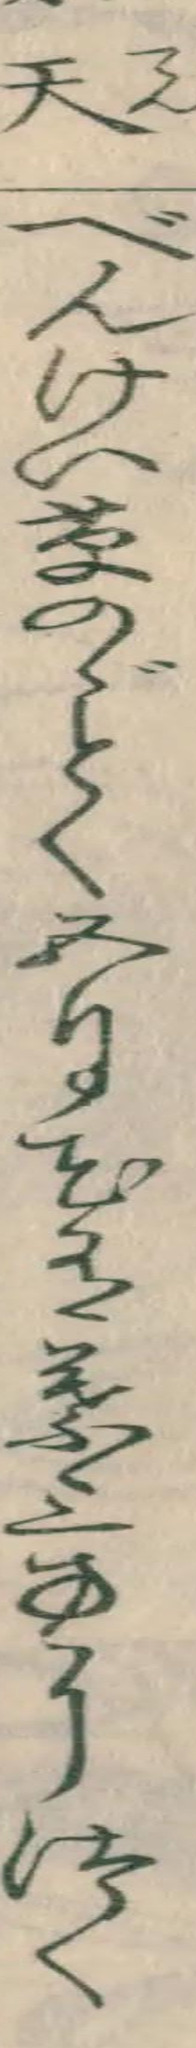べんけい草のごとく五月花有葉三方につく
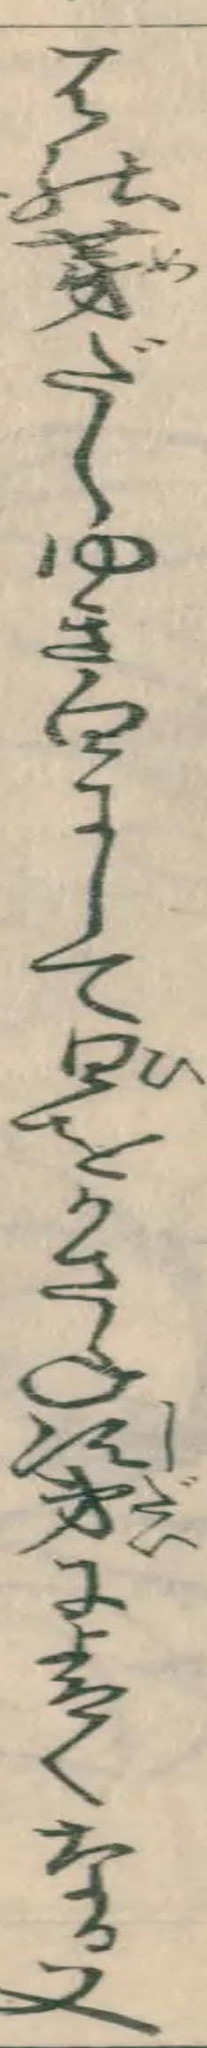はの芽だしゆき白にして日をかさね次第に青くなる又
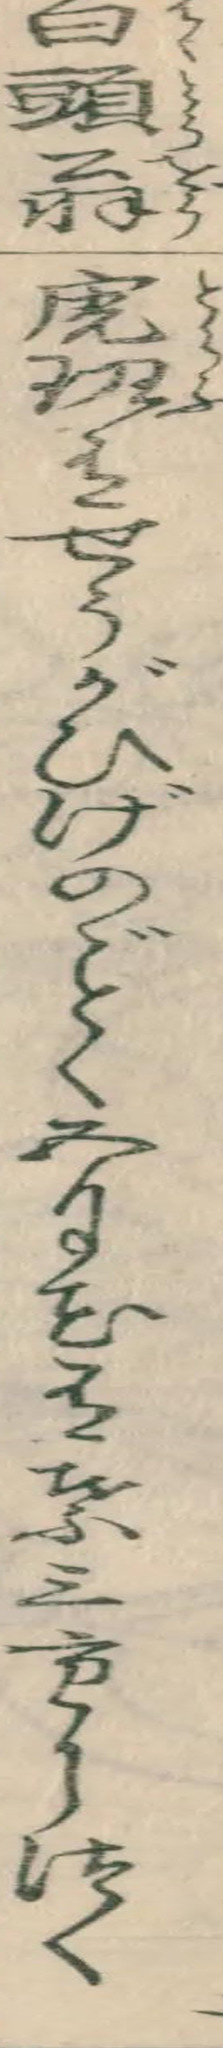虎班有せうがひげのごとく五月花有葉三方につく
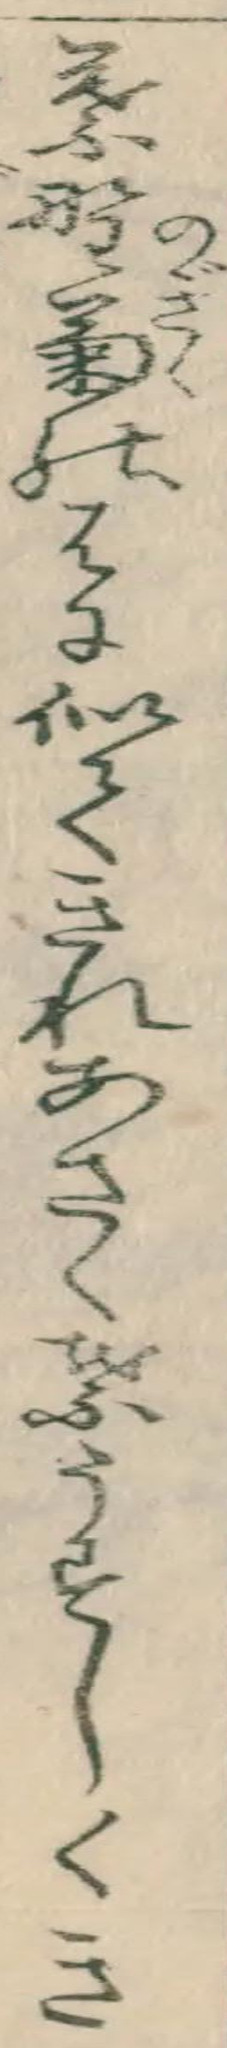葉野菊のはに似てきれあさく葉うすしくき
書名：畫本野山草. [5]
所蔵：国立国会図書館 National Diet Library, JAPAN
